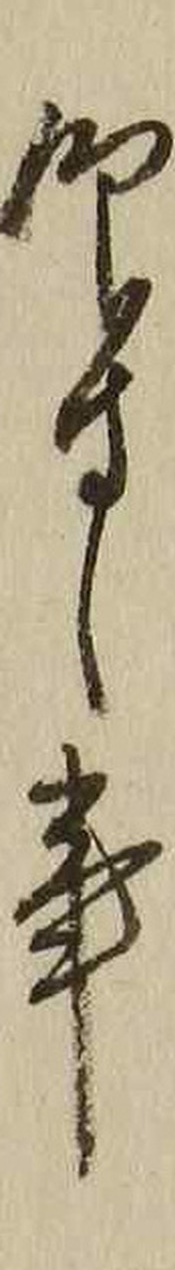仰付候事
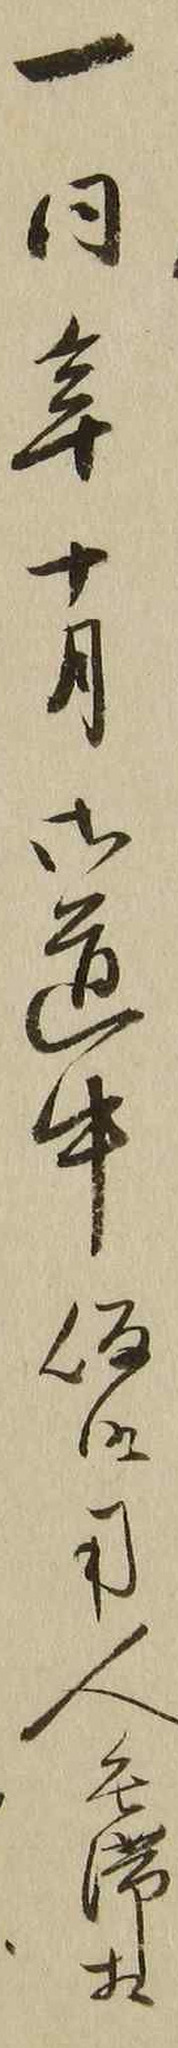一同年十月御道中任御用人無滞相
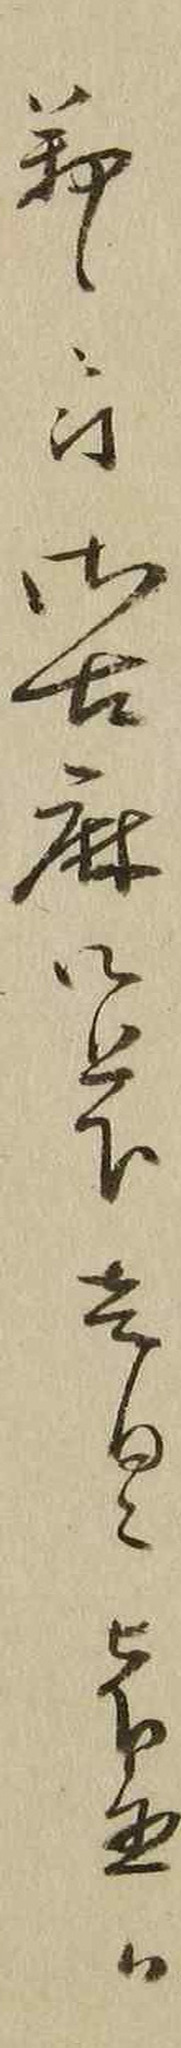勤候に付御古麻御上下壱具被下置候
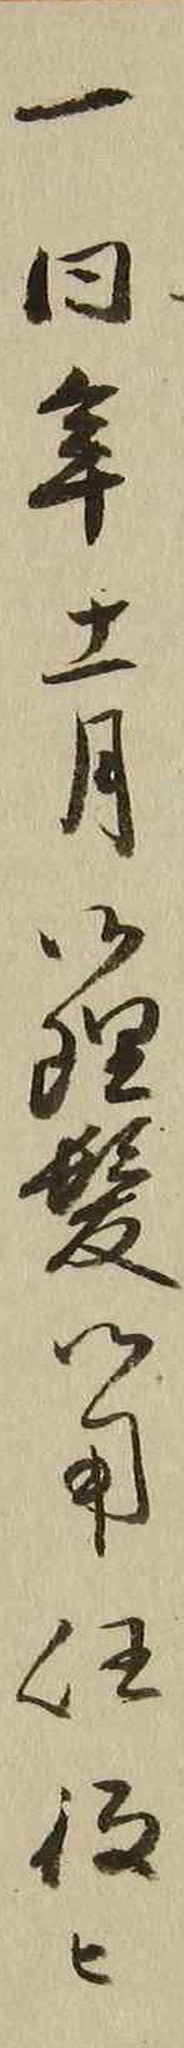一同年十一月御理髪御用任役被
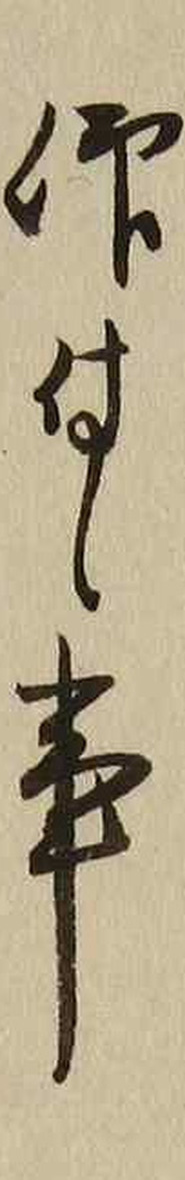仰付候事
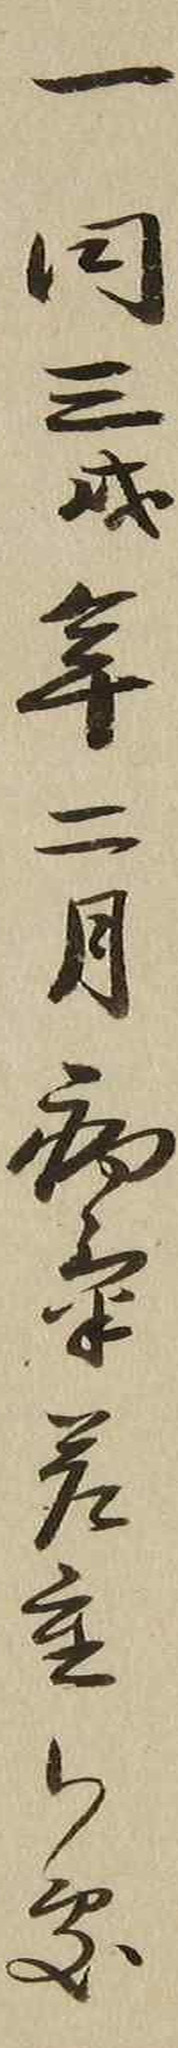一同三戌年二月病気差重候処
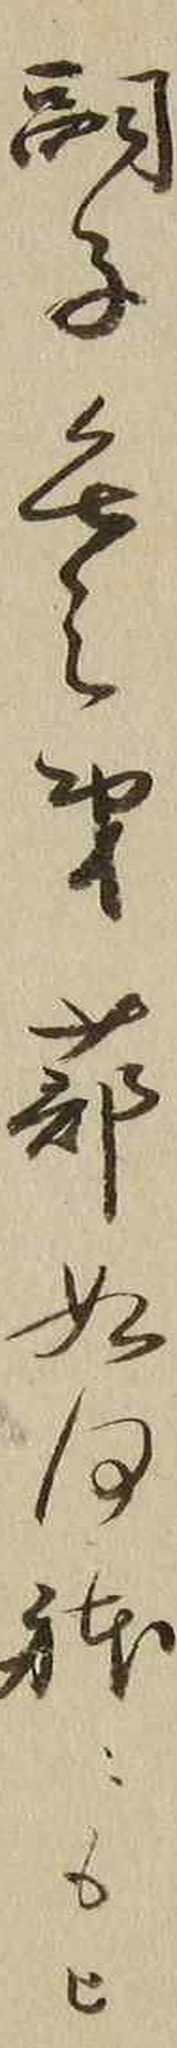嗣子無之弟蔀如何体に而も
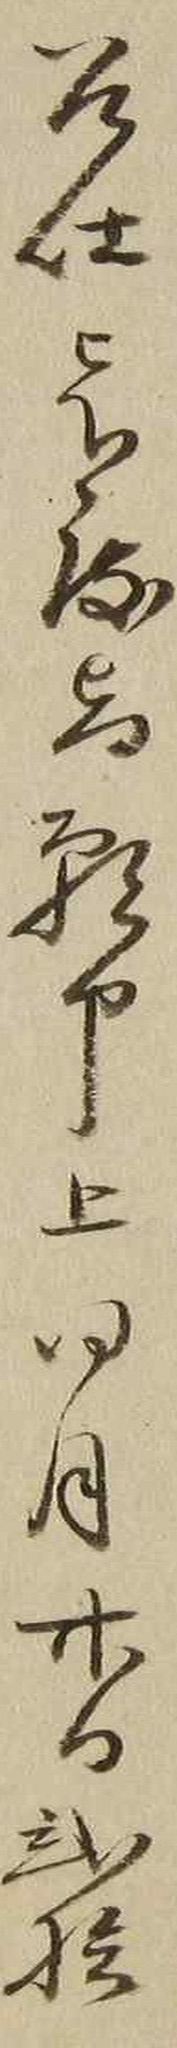召仕被下度旨願申上同月廿日弐拾
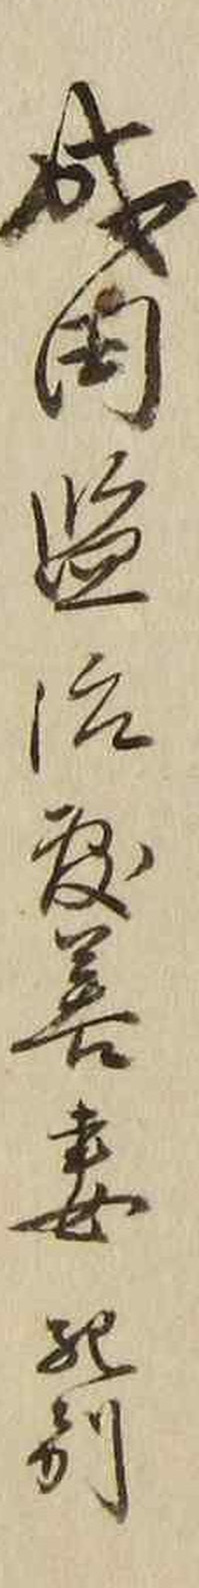女成田監治官善妻死別
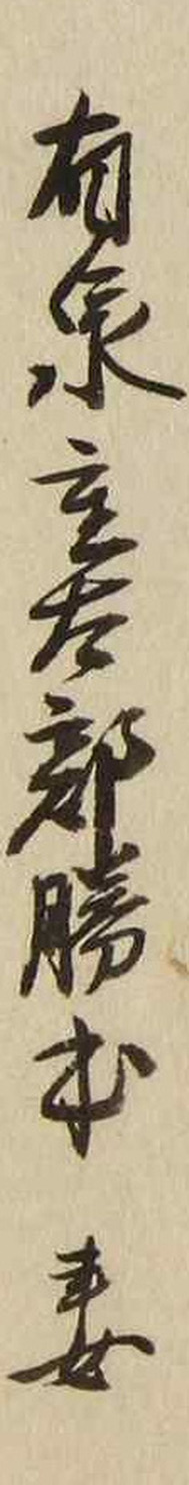有泉玄太郎勝本妻

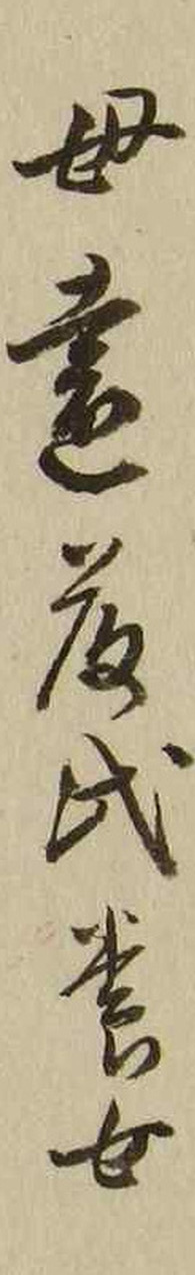母遠藤氏養女
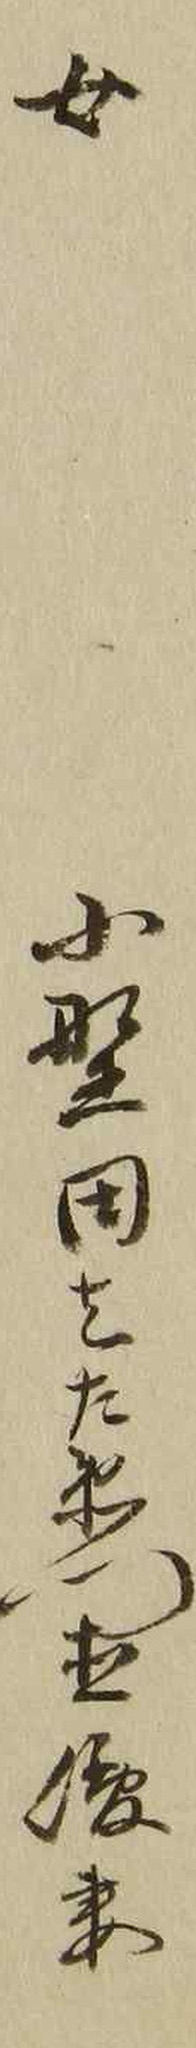女小野田与左衛門直俊妻
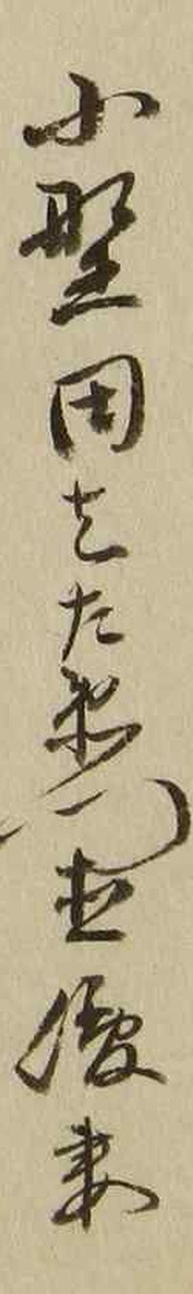女小野田与左衛門直俊妻
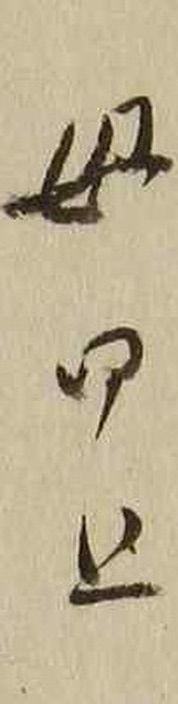母同上
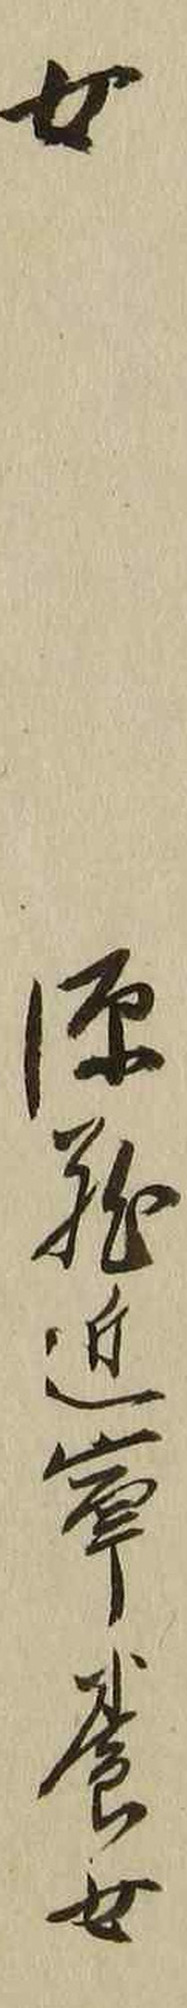女源蔵近峯養女
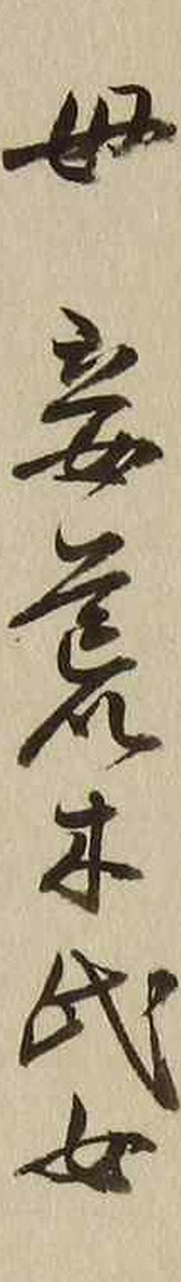母妾荒木氏女
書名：諸士系譜　巻之269　さ之部1
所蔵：会津若松市立会津図書館
